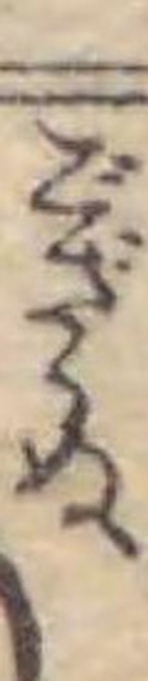ござらぬ
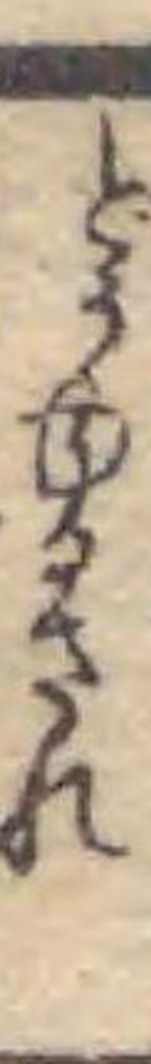どうゆるされ
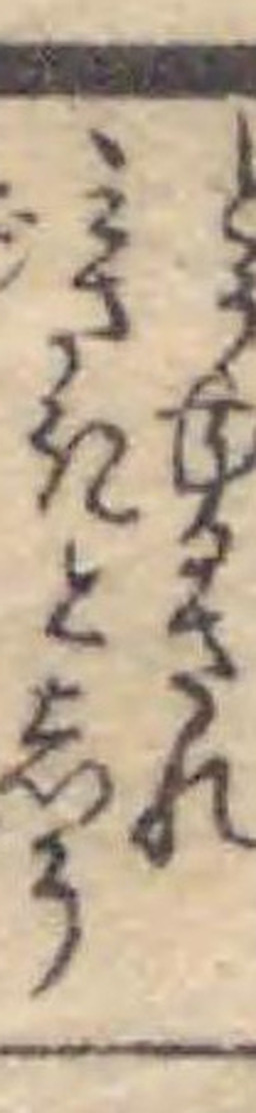みさきとしう
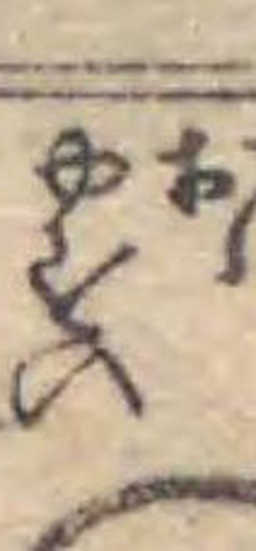やすい
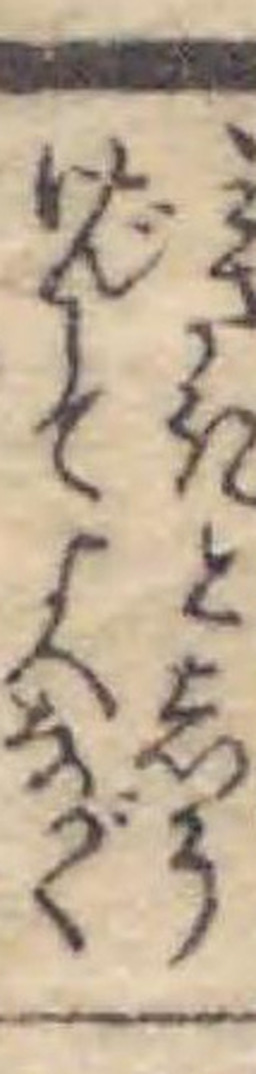げんしてすへながく
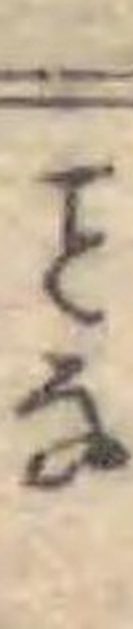ことな
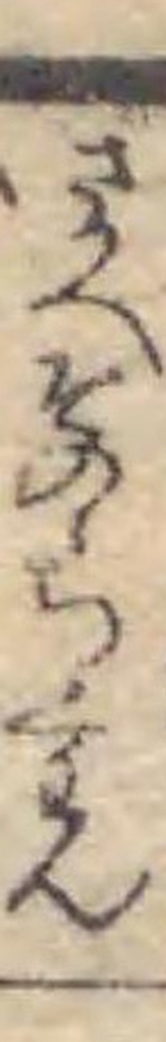さかへそのゝちくわん
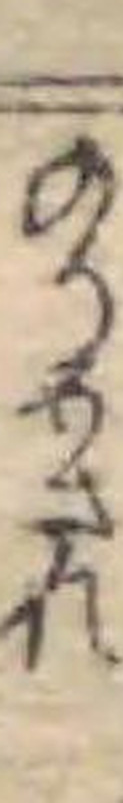のりめされ
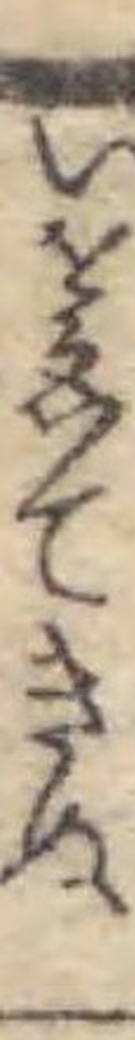いをゑてきぬ
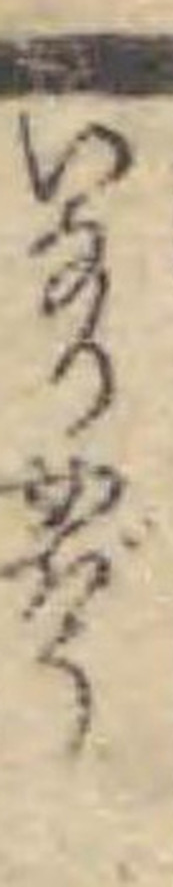いなり女ぼう
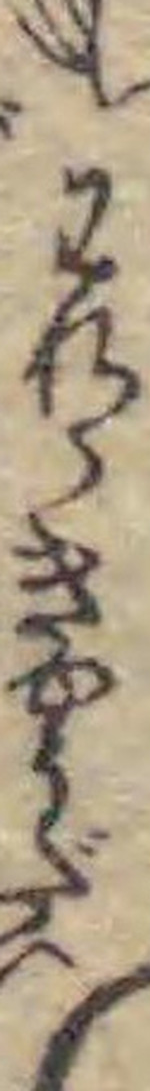われらきゃうだい
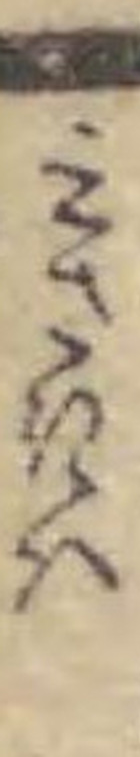みさきは
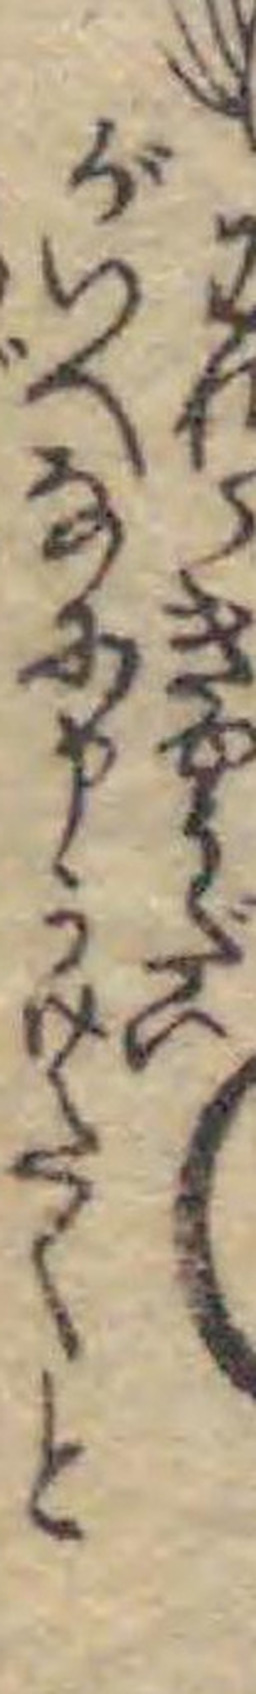がいへなに申うけたくと
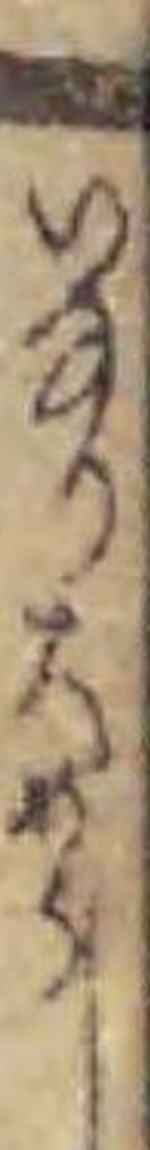いなり大めう
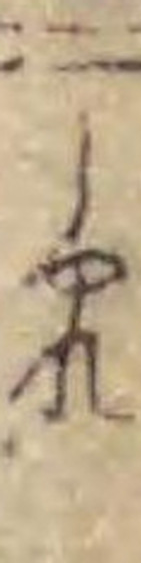しやれ
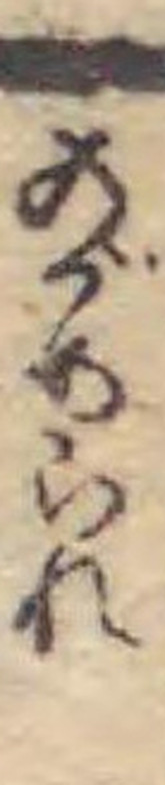あがめられ
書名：扨化狐通人 : 2巻
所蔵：国立国会図書館 National Diet Library, JAPAN
